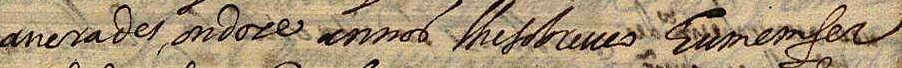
avera des, ou doze annos lhe sobreveo hum emfer
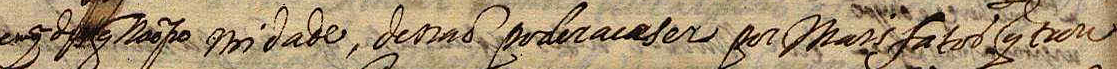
midade, de não poder acaser por mais fatos q̄ trou
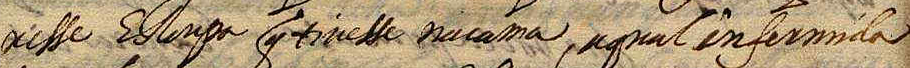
xesse e Roupa q̄ tivesse na cama, a qual enfermida
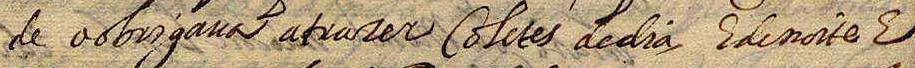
de o obrigava a trazer Coletes de dia, e de noite e
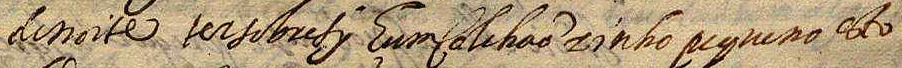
de noite ter sobre sy hum Colchaõzinho pequeno esto
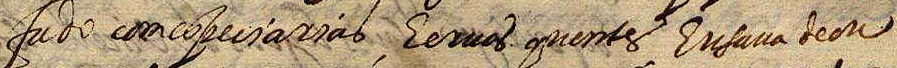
fado com especiarias, hervas quentes e usava de ou
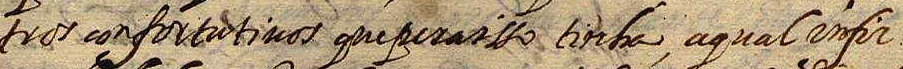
tros confortativos que pera isso tinha, a qual enfir
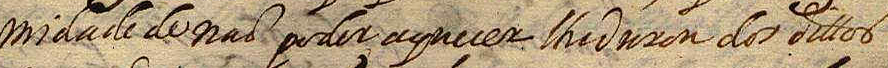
midade de não poder aqueçer lhe durou dos dittos
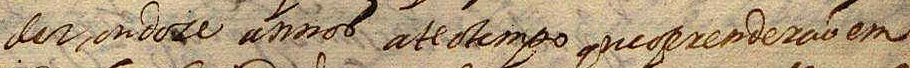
dez, ou doze annos ate o tempo que o prenderão em
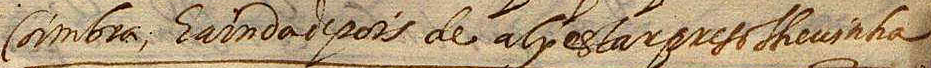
Coimbra, e ainda depois de aly estar preso lhe vinha
